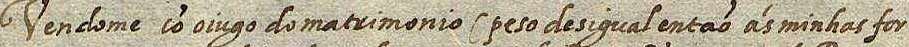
Vendome cō o iugo do matrimonio (peso desigual entaõ ás minhas for
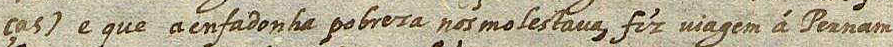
ças) e que a enfadonha pobreza nos molestaua, fiz̄ uiagem á Pernam
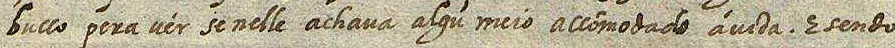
bucco pera uér se nelle achaua algū meio accōmodado á uida. E sendo
